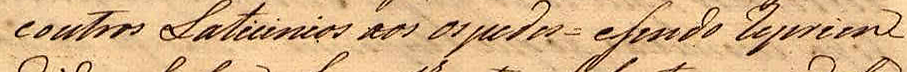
e outros Laticinios aos ospedes = e sendo Reprien
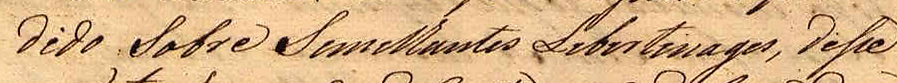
dido Sobre Semelhantes Libertinages, disse
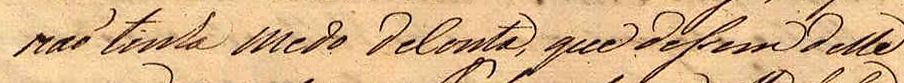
naõ tinha medo de Conta, que dessem delle
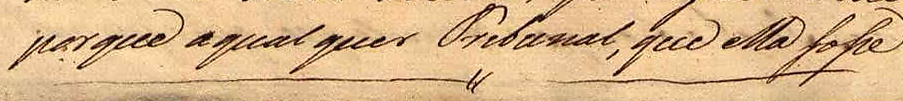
porque a qualquer Tribunal, que ella fosse
